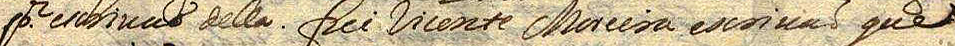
p.a escriuaõ della. frei Vicente Moreira escriuaõ que
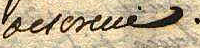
o escreui.
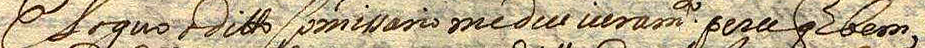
E loguo o ditto Com̄issario me deu iuramto. pera q̄ bem, e
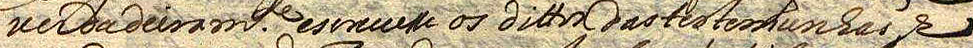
uerdadeiram.te escreuesse os dittos das testemunhas, E
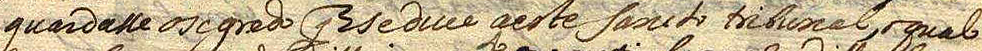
guardasse o segredo q̄ se deue a este sancto tribunal, o qual
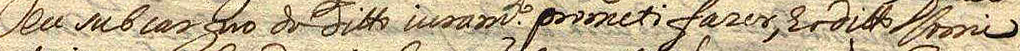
eu sub carguo do ditto iuram.to prometi fazer, E o ditto Comi
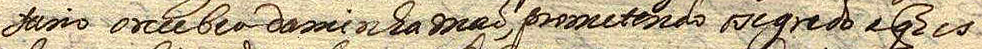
sario o recebeo da minha maõ, prometendo o segredo e q̄ es
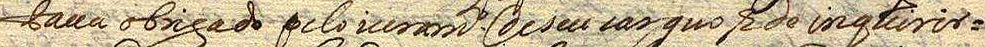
taua obrigado pelo iuramto. de seu carguo, E de inquirir
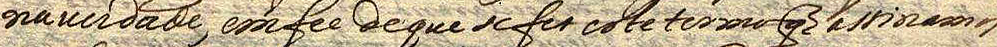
na uerdade, em fee de que se fez este termo q̄ assinamos
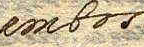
ambos
